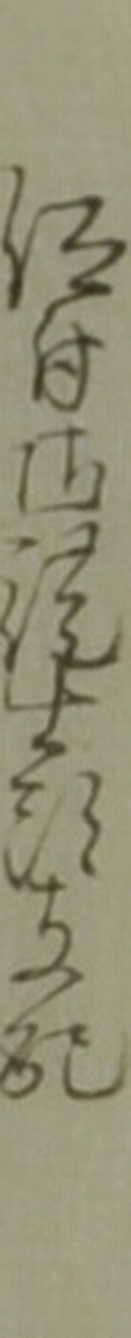仰付御徒士頭支配
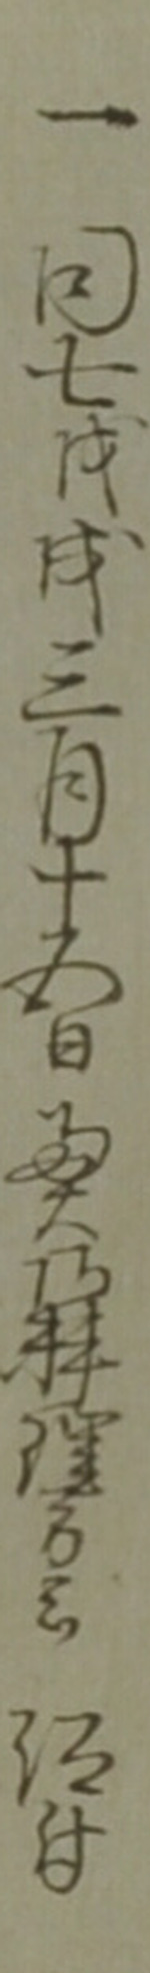一同七戊戌三月十五日奥御料理方被仰付
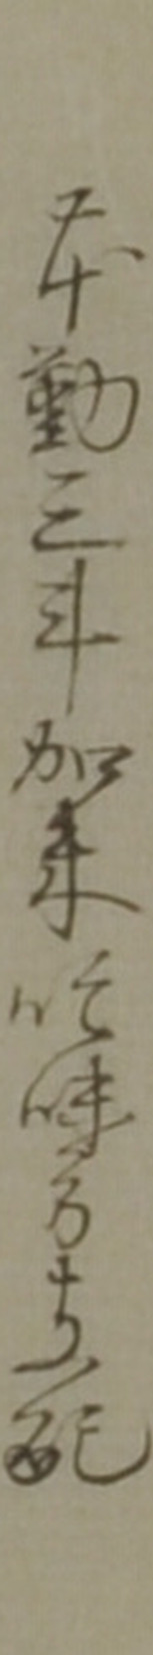本勤三斗加米吟味方支配
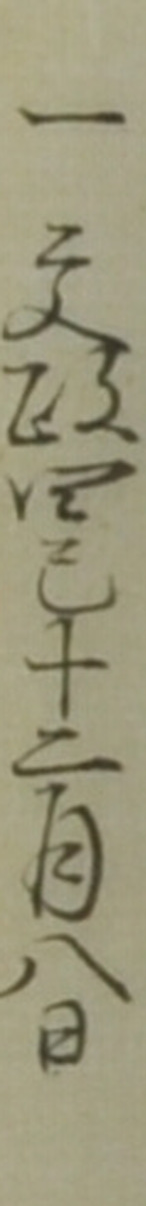一文政四巳十二月八日
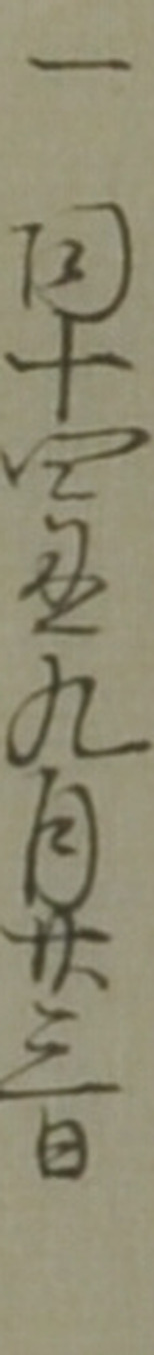一同十四丑九月廿三日

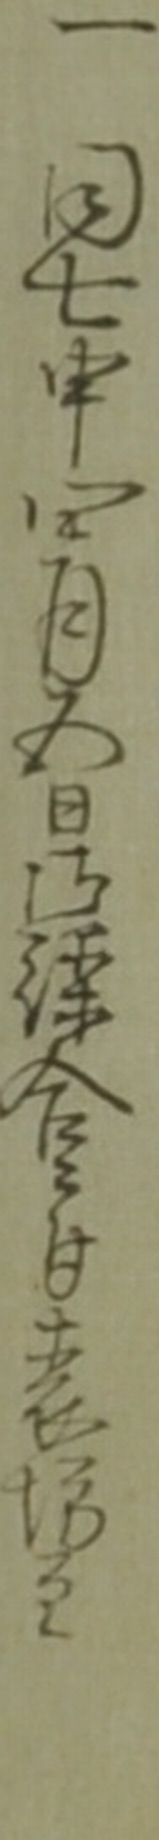一同七申四月五日御繰合ニ付表坊主
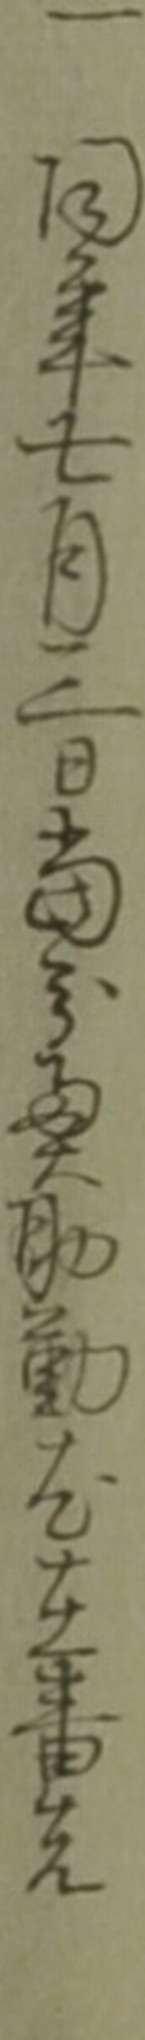一同年七月三日当分奥助勤尤在番先
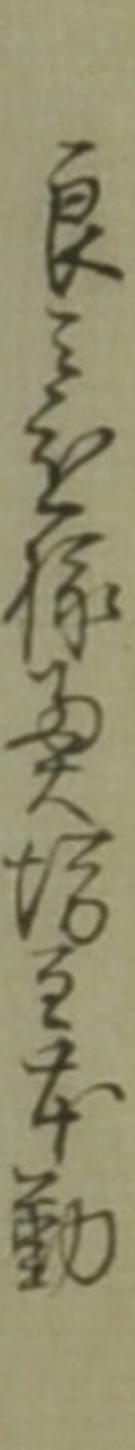良之進様奥坊主本勤
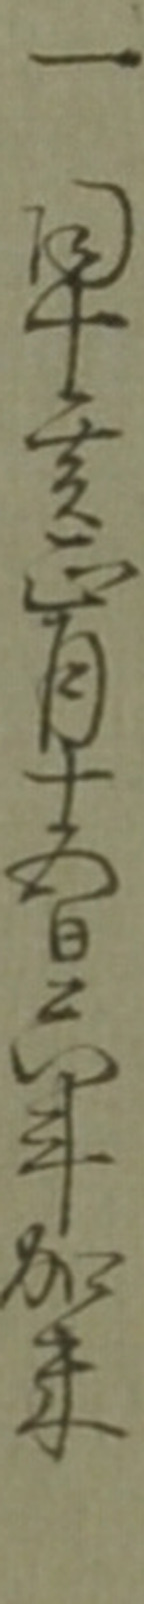一同十亥正月十五日六斗加米
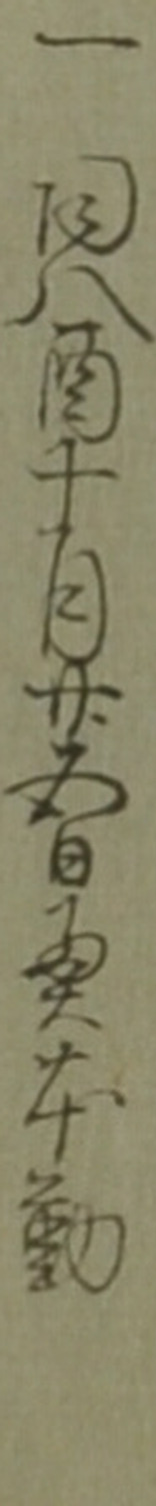一同八酉十月廿五日奥本勤
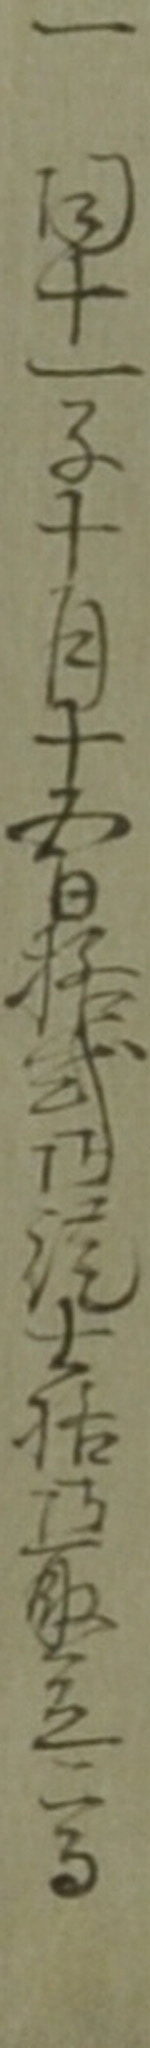一同十一子十月十五日格式御徒士格御取立高
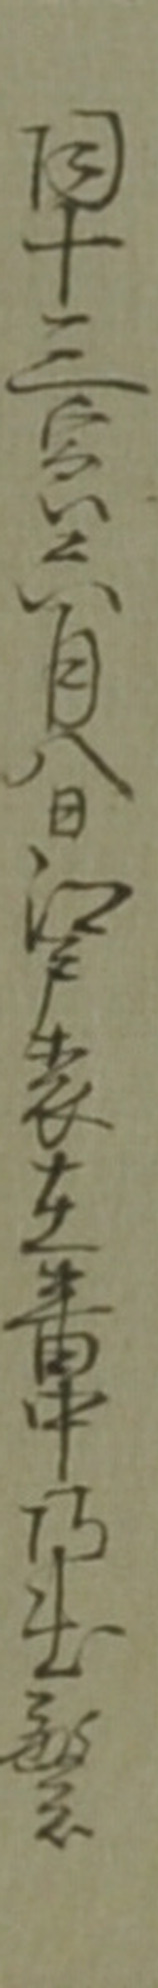一同十三寅六月八日江戸表在番中御出繁
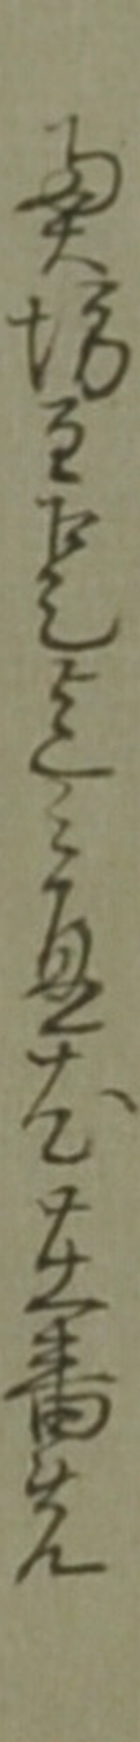奥坊主是迄之通尤在番先
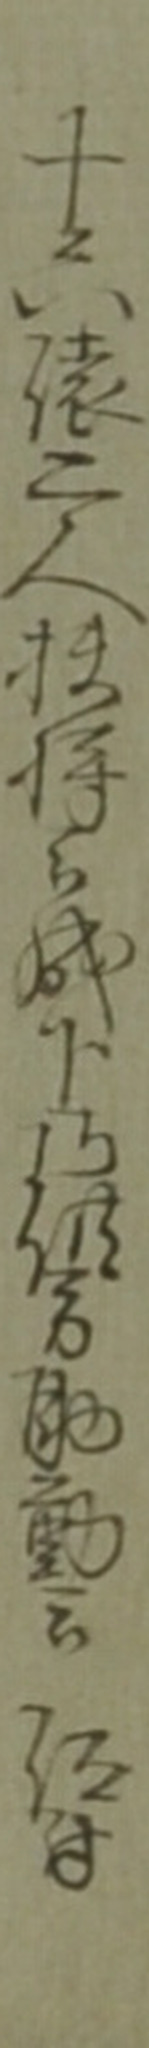十六俵二人扶持被成下御供方助勤被仰付
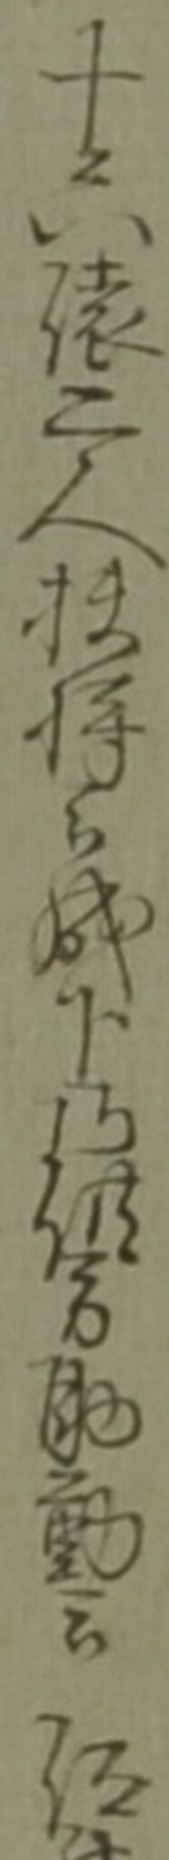十六俵二人扶持被成下御供方助勤被仰付
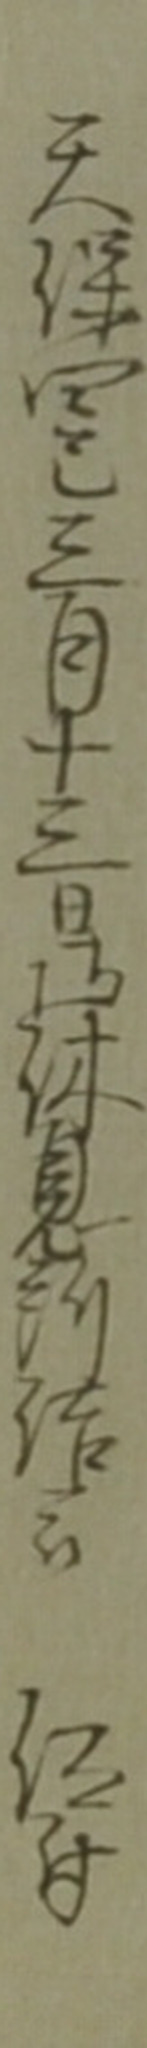一天保四巳三月十三日御休息所詰被仰付
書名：無足諸士勤仕録（九）
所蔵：伊那市立高遠町図書館・合同会社AMANE
